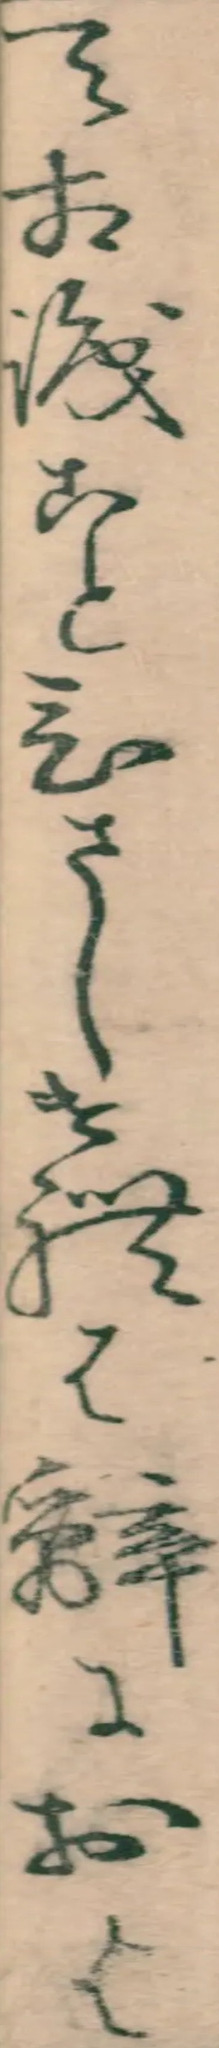て相識ことひさしけれは辞におよ
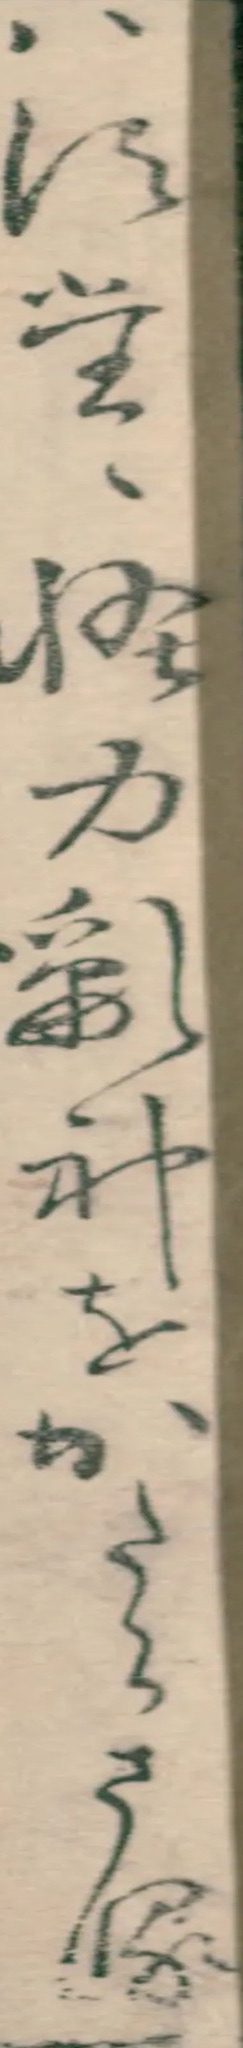はすたゝ怪力乱神をかたらさる
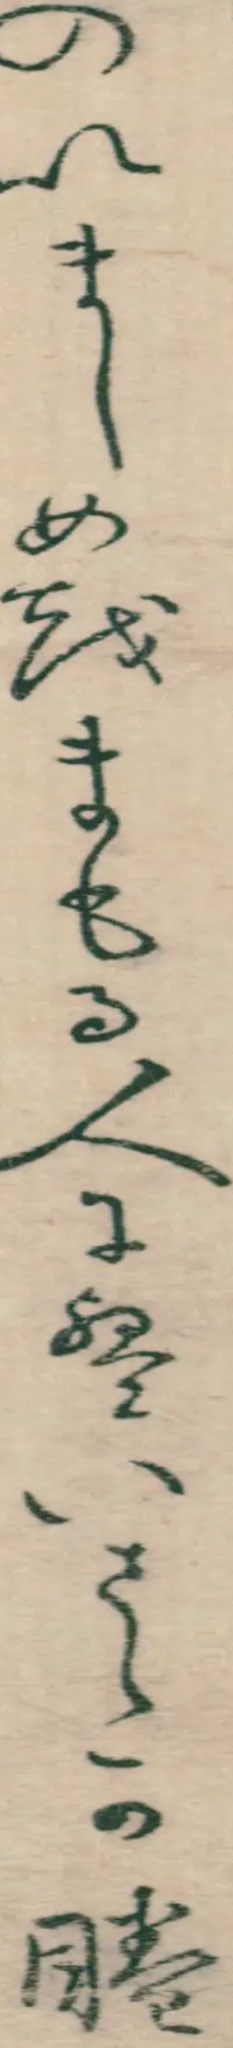のいましめをまもる人にはいさゝか睠
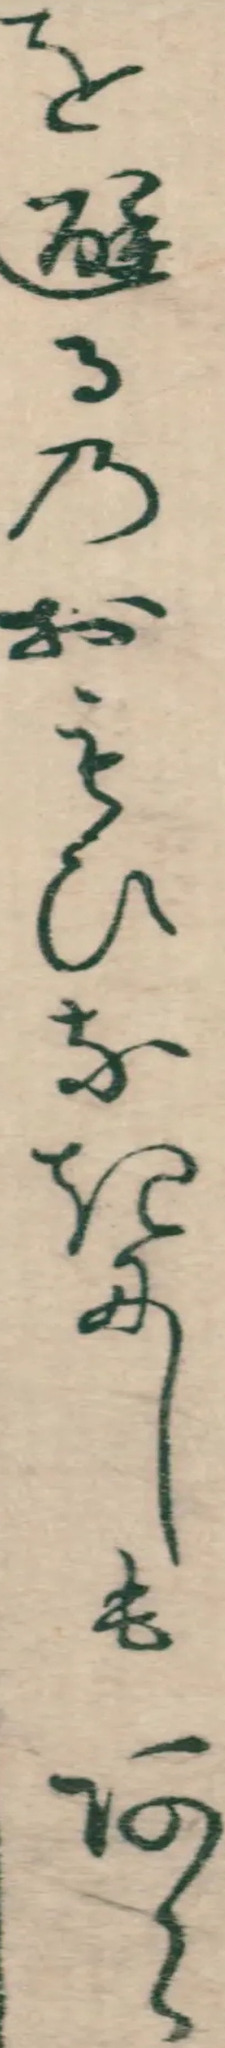を避るのおもひなきにしもあら
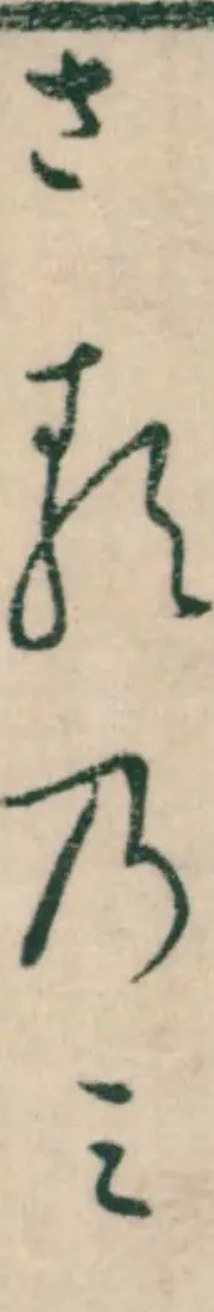さるのみ
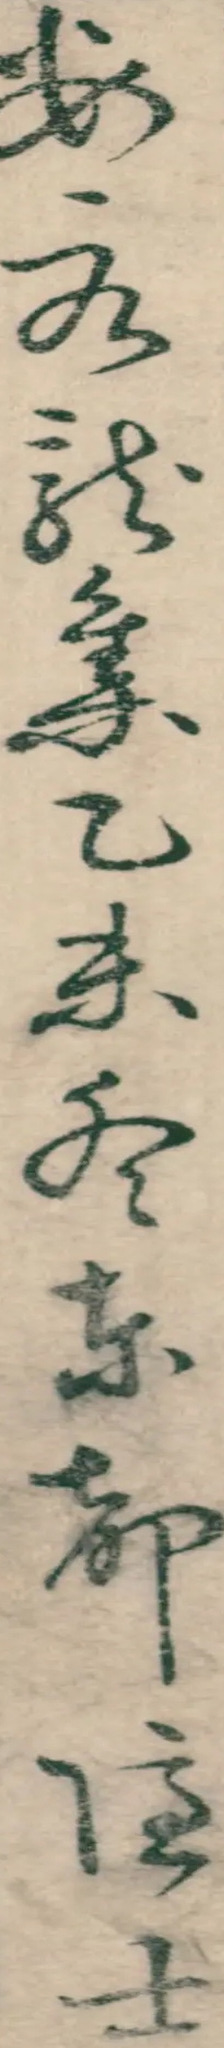安永龍集乙未冬東都隠士
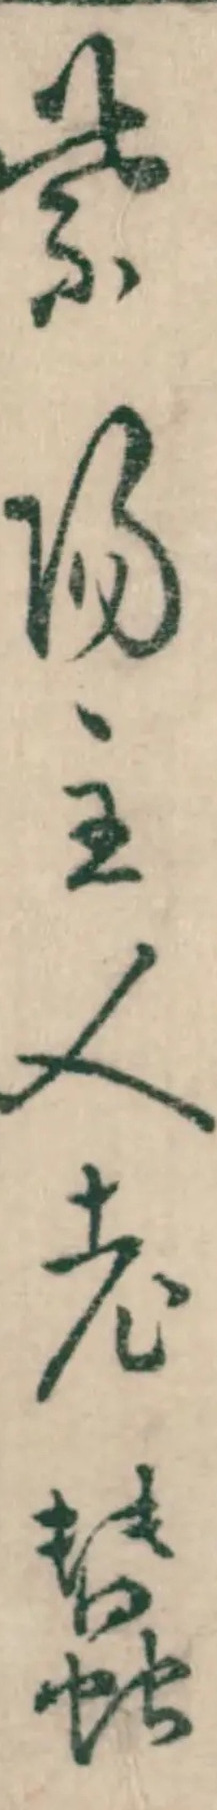紫陽主人老蠶

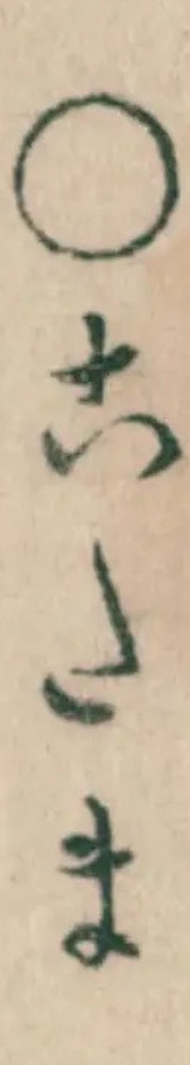○こたま
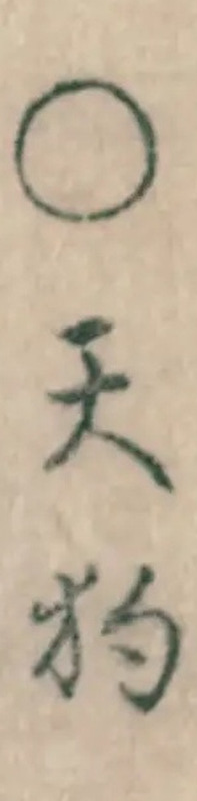○天狗
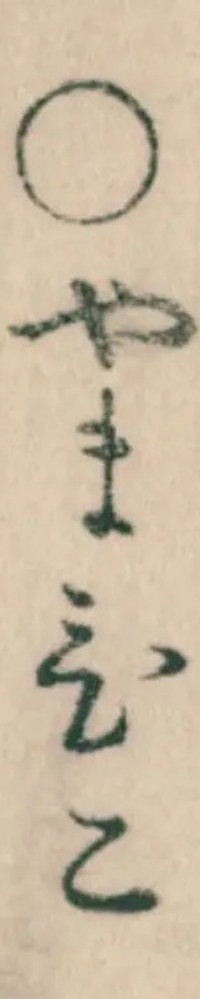○やまひこ
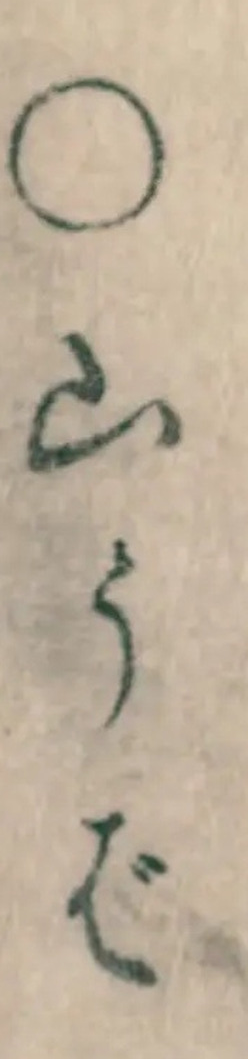○山うば
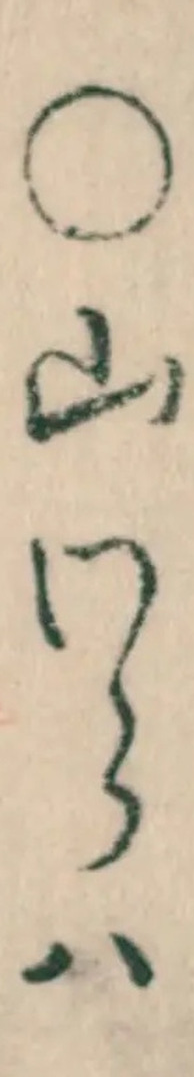○山わらは
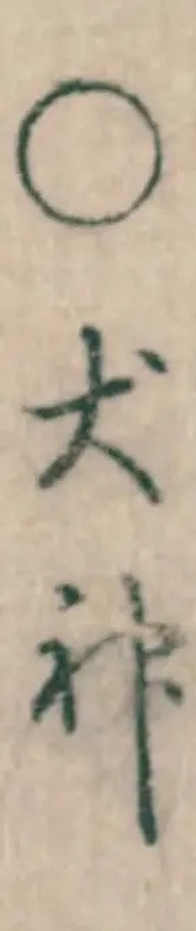○犬神
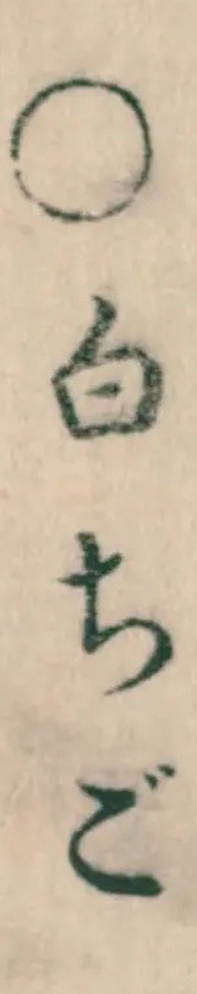○白ちご
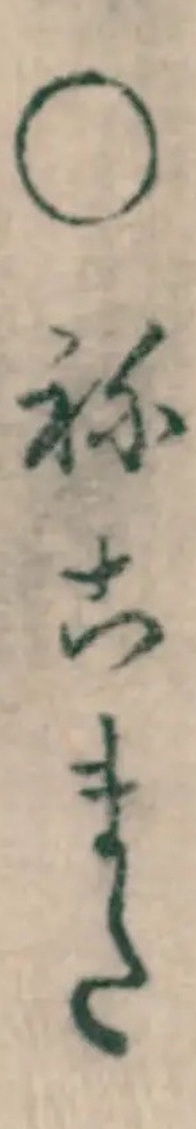○ねこまた
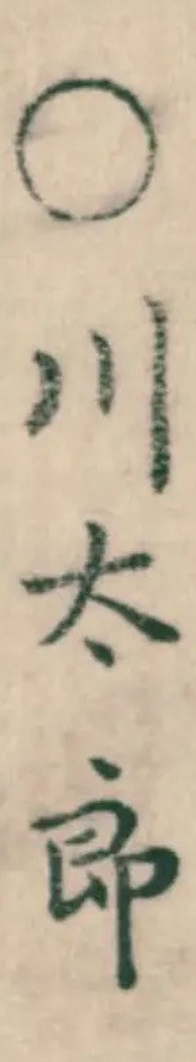○川太郎
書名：百鬼夜行 3巻拾遺3巻. [1]
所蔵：国立国会図書館 National Diet Library, JAPAN
